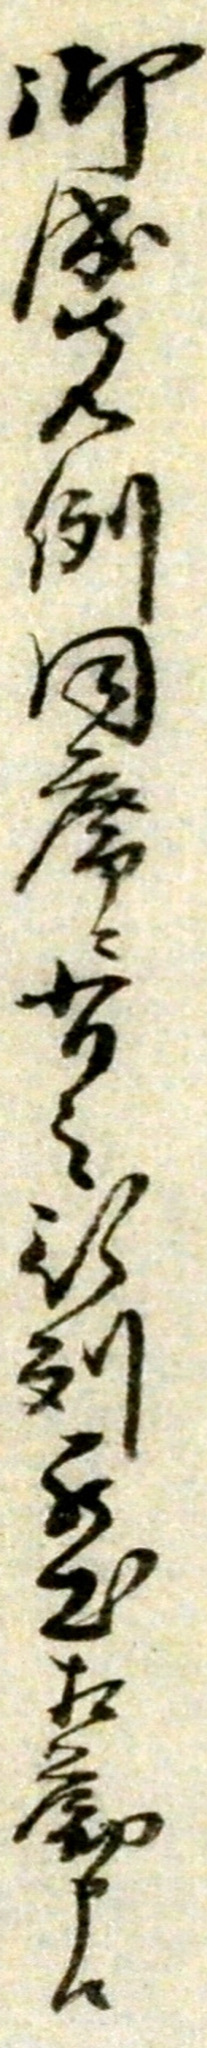御成先例同席ニ有之行列罷出相勤申候
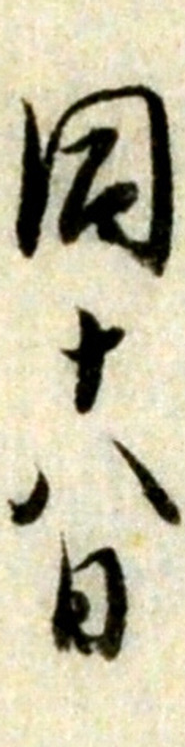同十八日
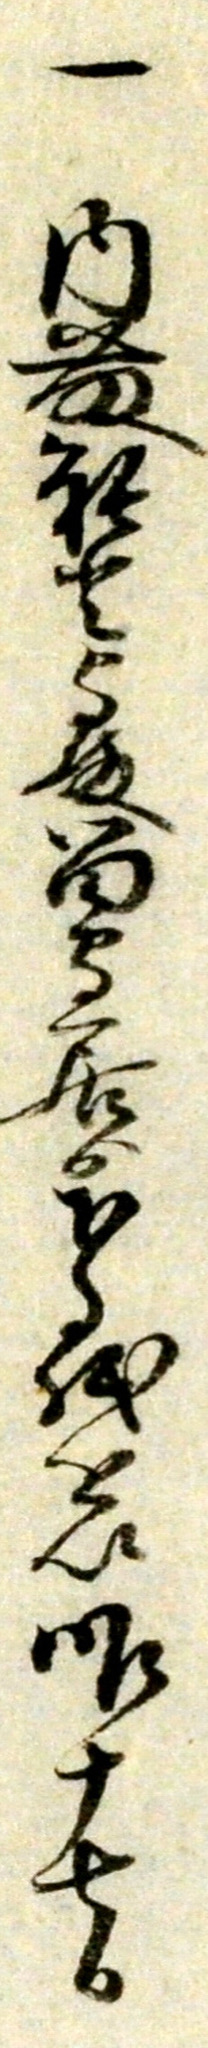一内藤能登守殿留守居ゟ下手紙を以昨十七日
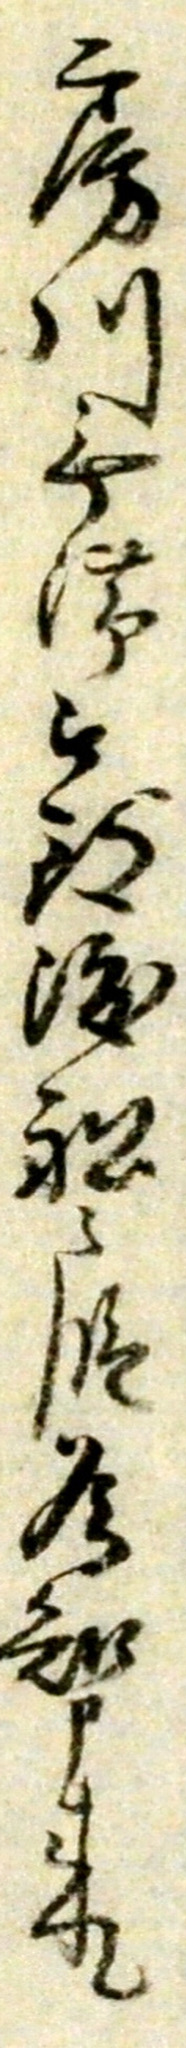房川無滞被致渡船候段為知申来ㇽ
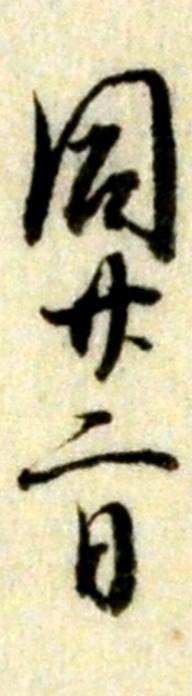同廿ニ日
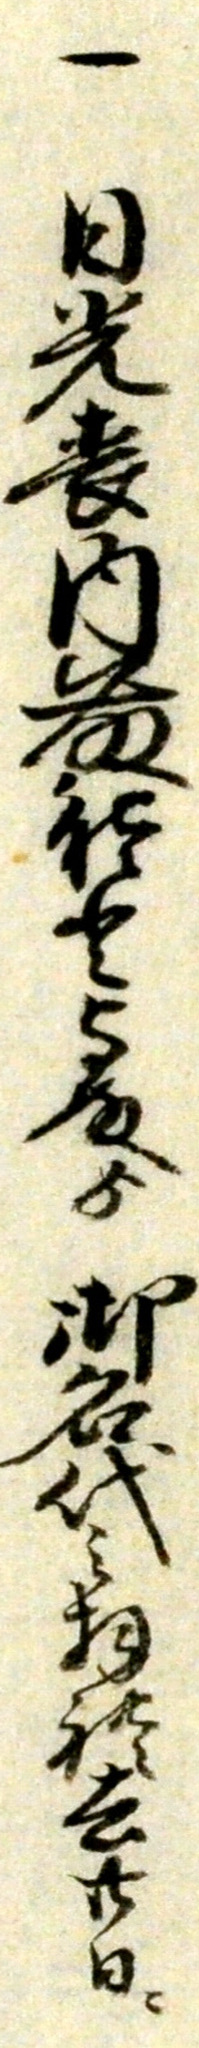一日光表内藤能登守殿ゟ御名代之拝礼去廿日ニ
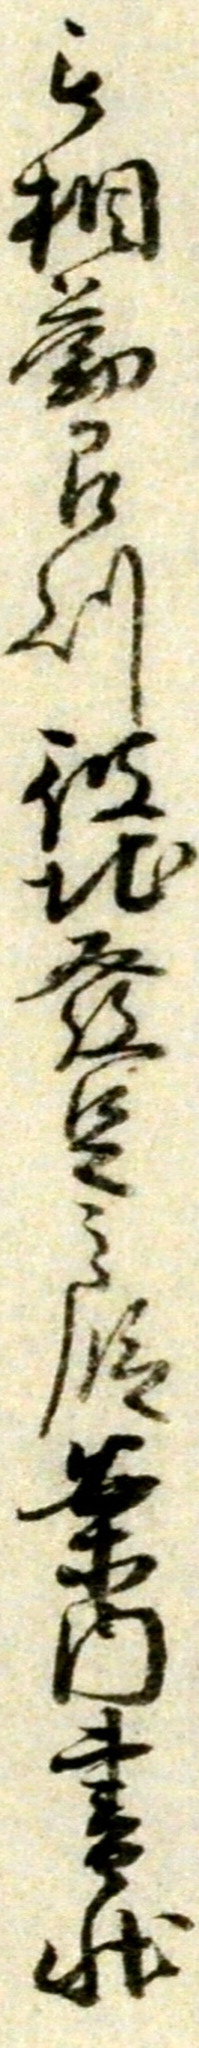被相勤即刻彼地発足之段案内書状
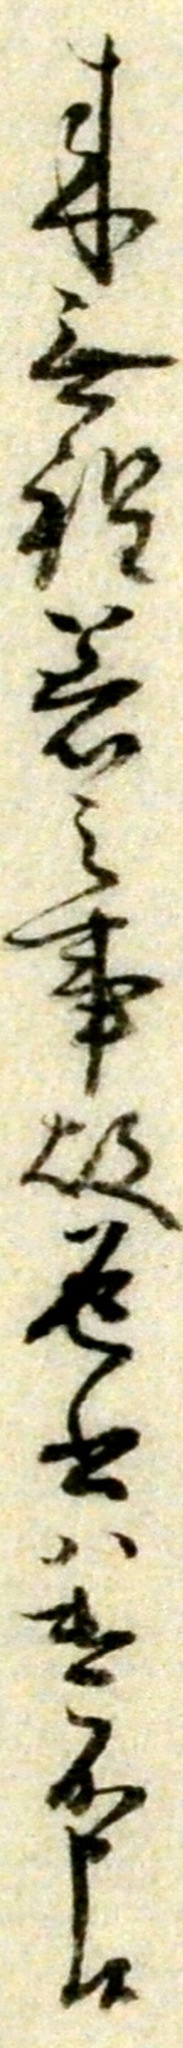来無程着之事故返書ハ遣不申候
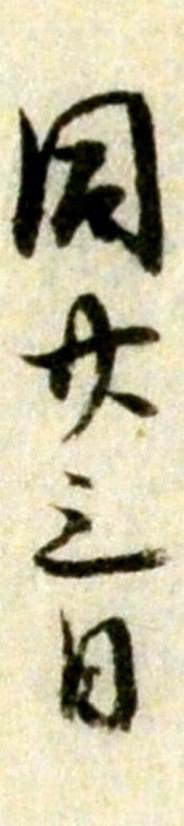同廿三日
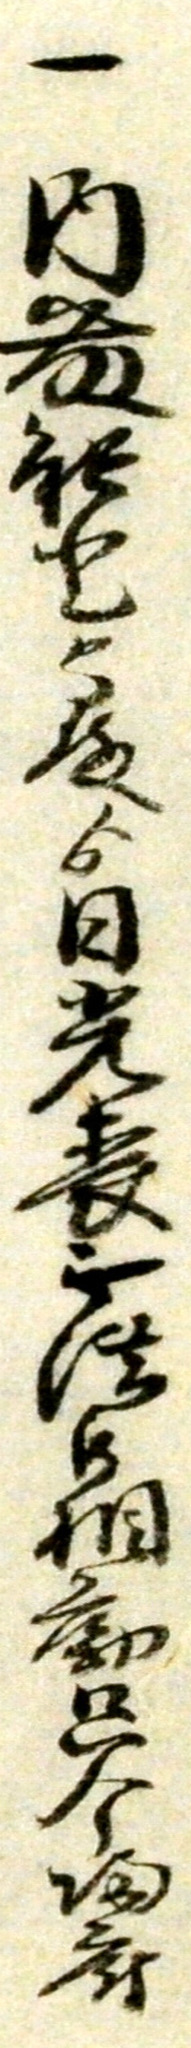一内藤能登守殿ゟ日光表無滞被相勤只今帰府
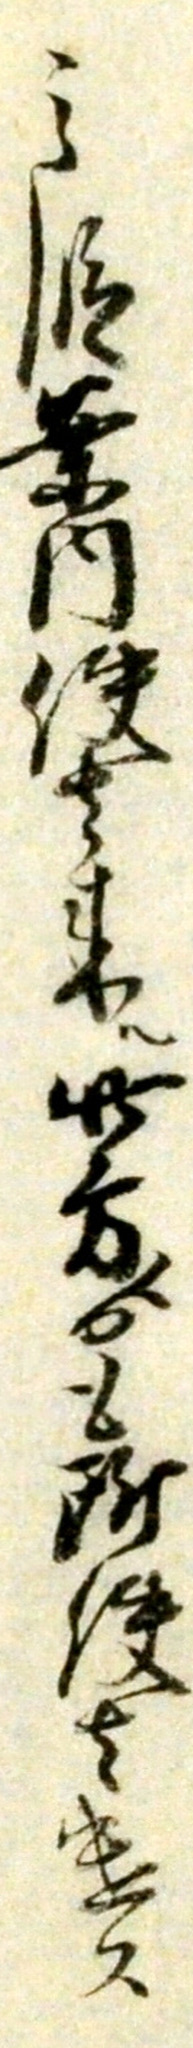之段案内使者来ㇽ此方ゟも附使者遣ㇲ
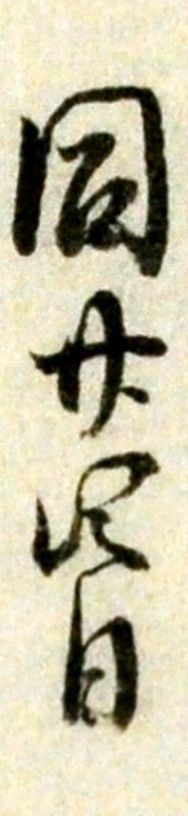同廿四日
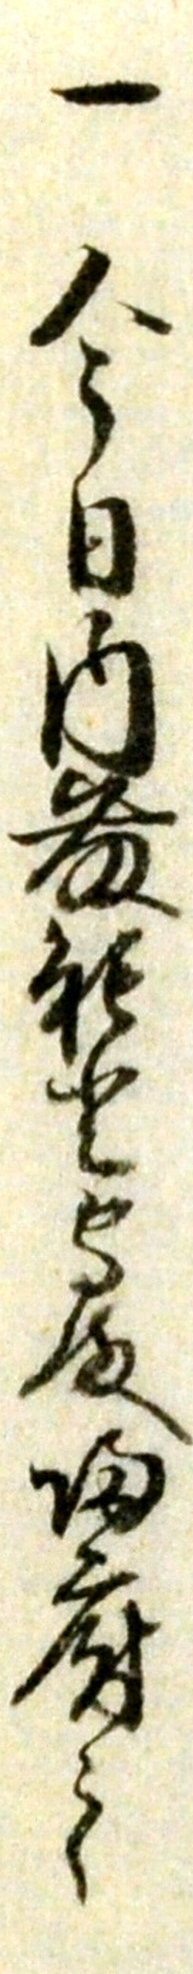一今日内藤能登守殿帰府之

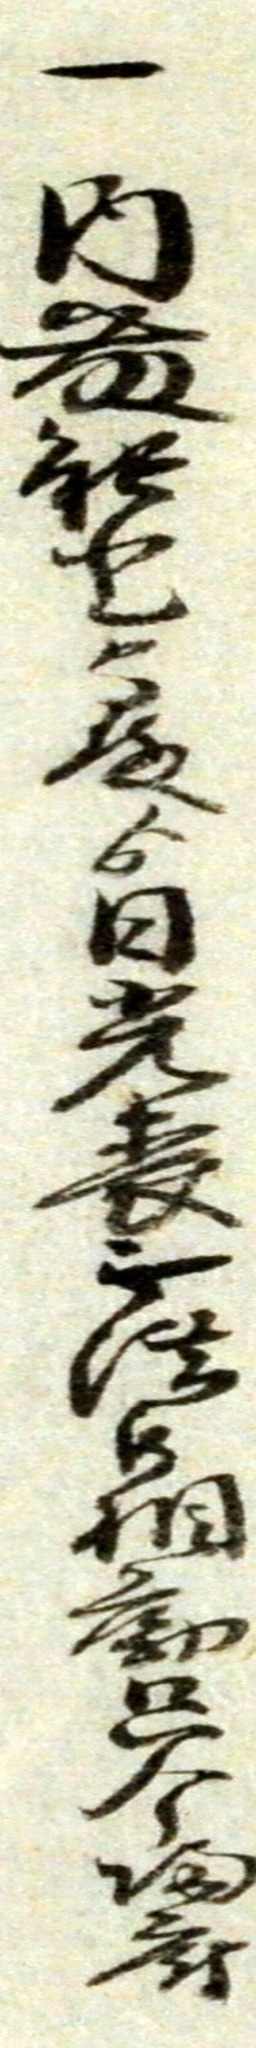一内藤能登守殿ゟ日光表無滞被相勤只今帰府
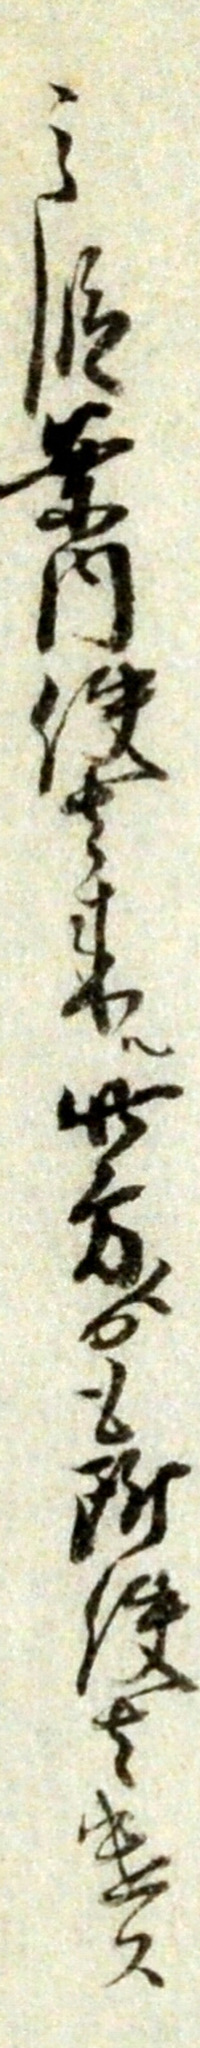之段案内使者来ㇽ此方ゟも附使者遣ㇲ
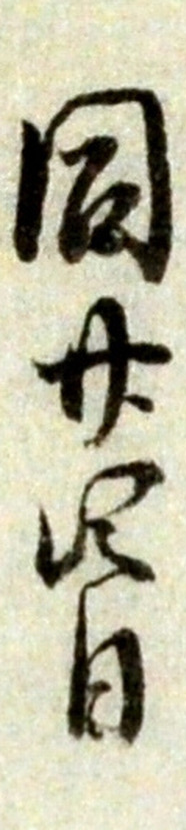同廿四日
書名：日光御名代相勤候節ノ留
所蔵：伊那市立高遠町図書館・合同会社AMANE
